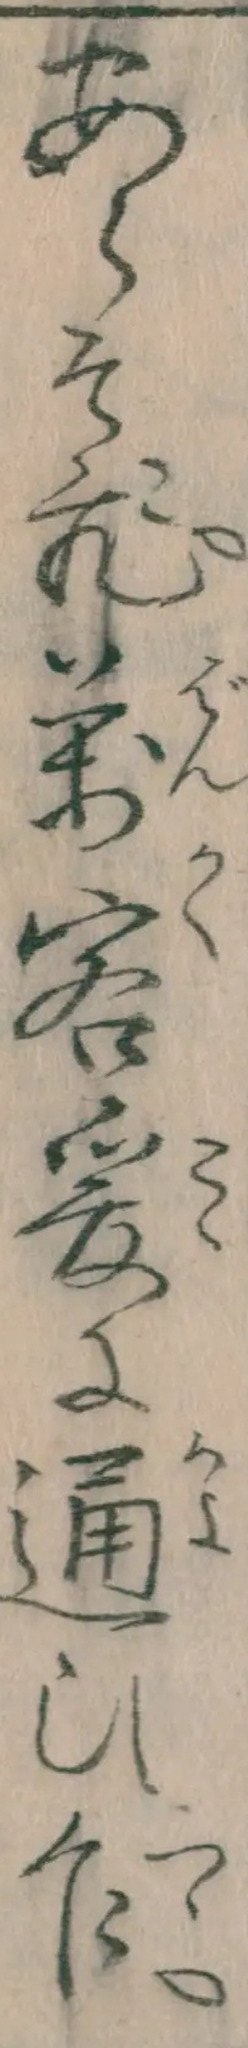あらそひ。万客爰に通ひ乍。
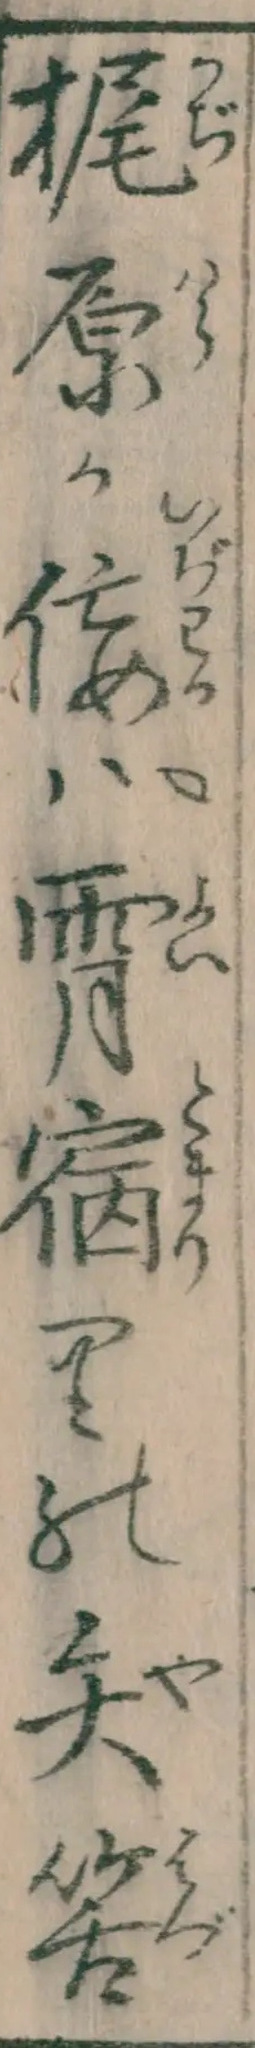梶原か佞は。宵宿りの矢筈
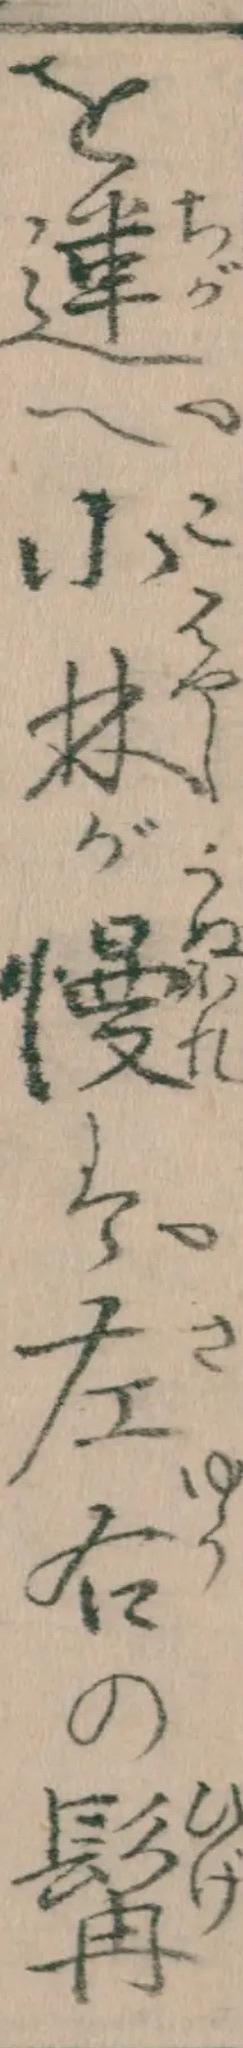を違へ。小林が慢は。左右の髯
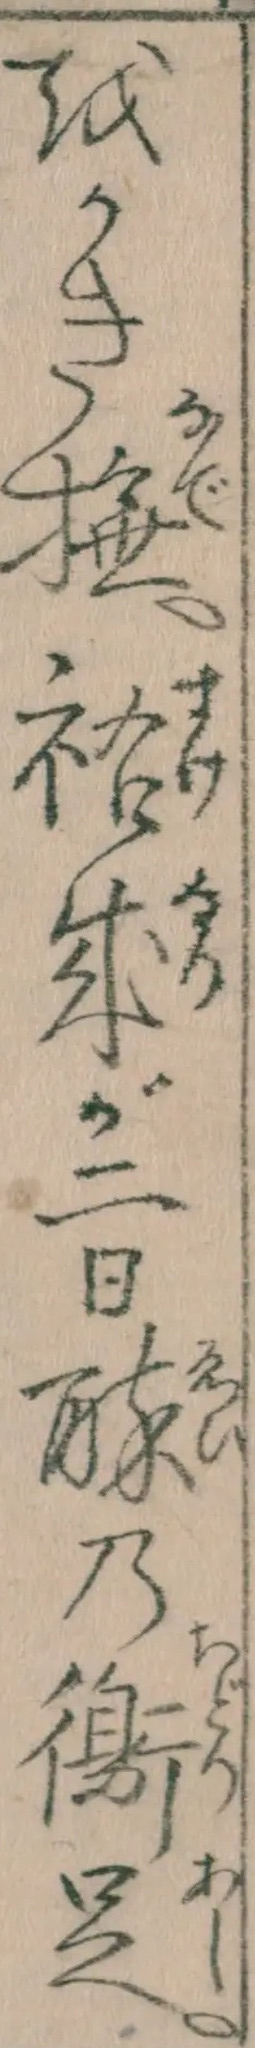をかき撫。裕成が二日酔の鵆足。
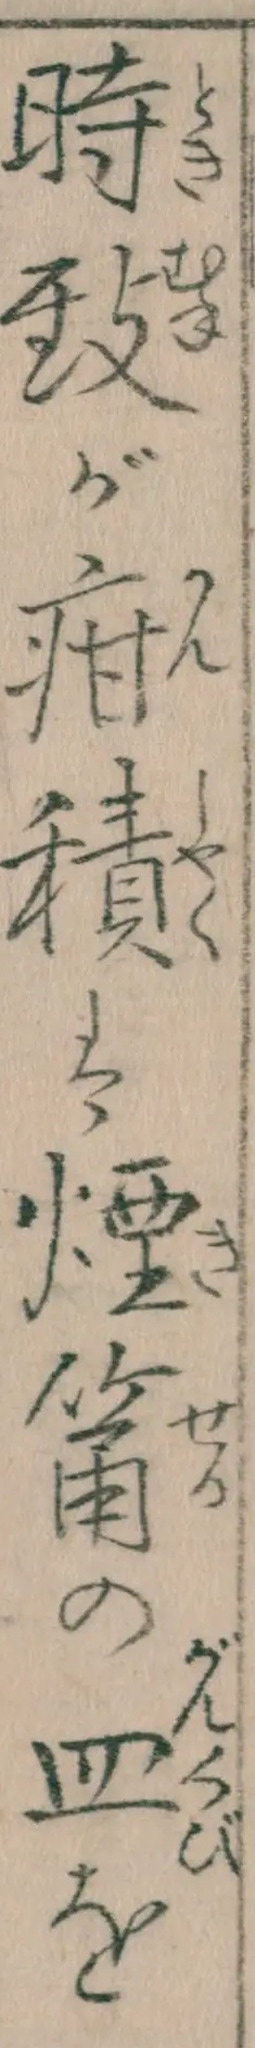時致が疳積は煙筩の皿を
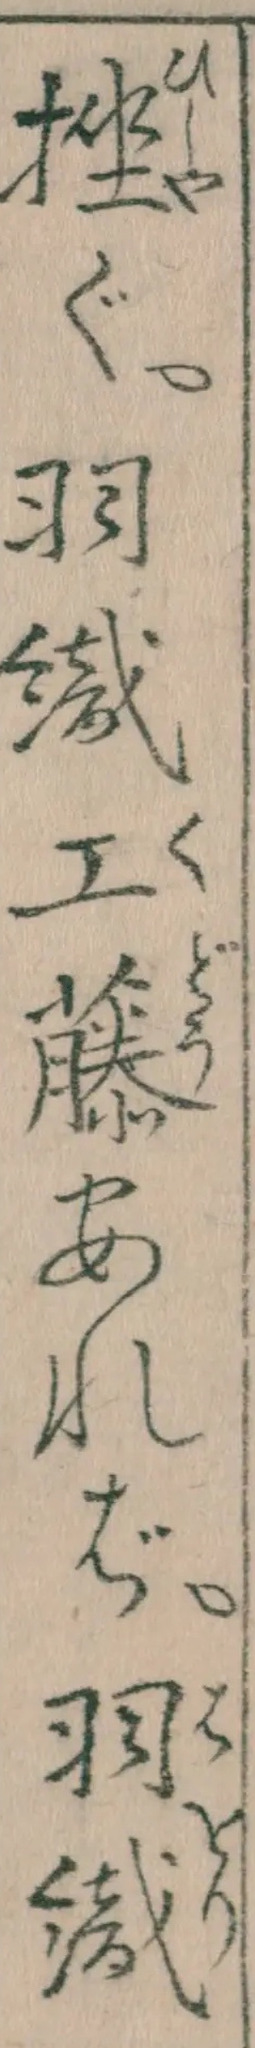挫ぐ。羽織工藤あれば。羽織
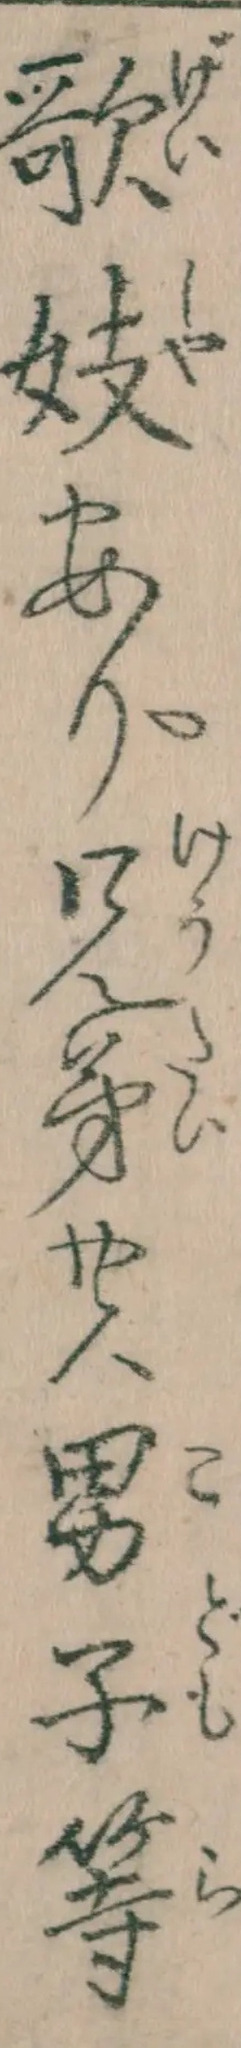歌妓あり。兄弟の男子等
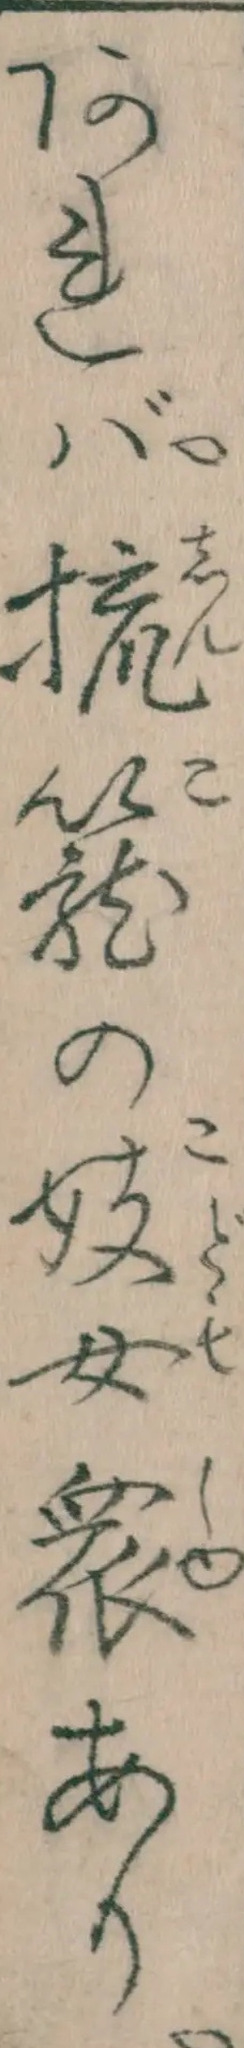あれば。㧧籠の妓女衆あり。

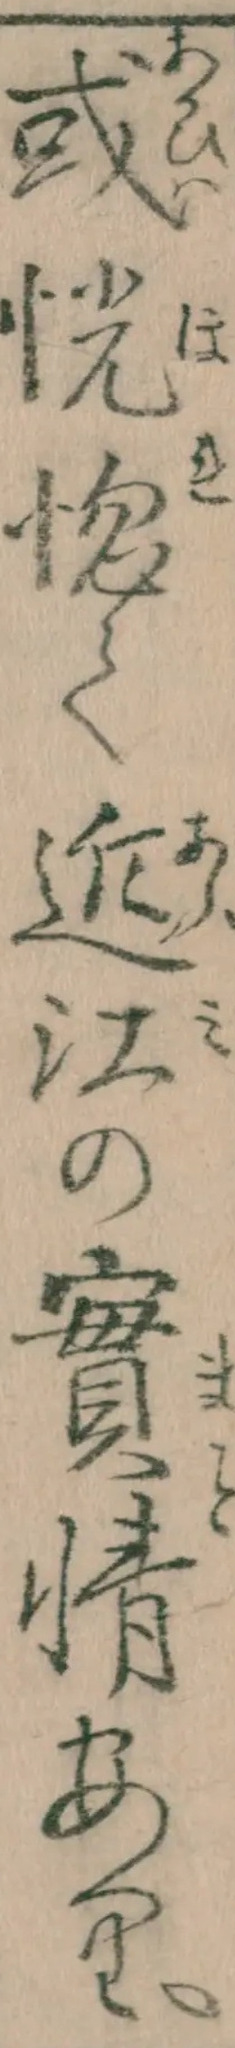或恍惚て近江の実情あり。
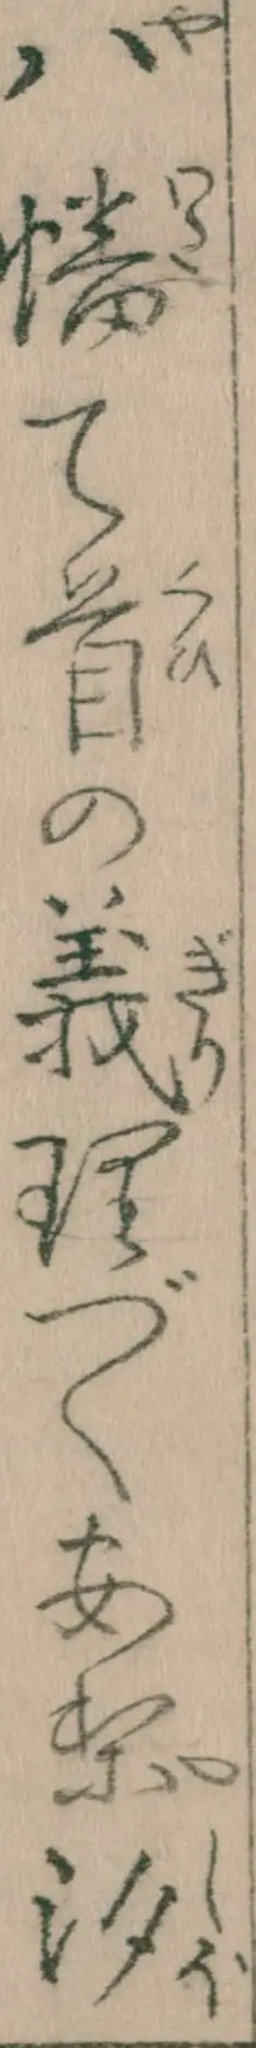八幡て首の義理づくあり。汐
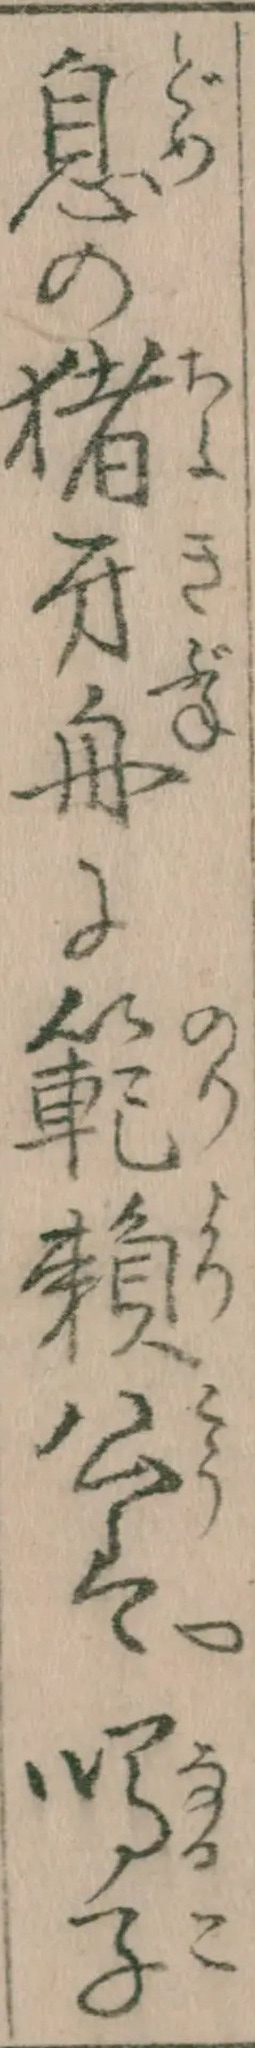息の猪牙舟に範頼公は。鳴子
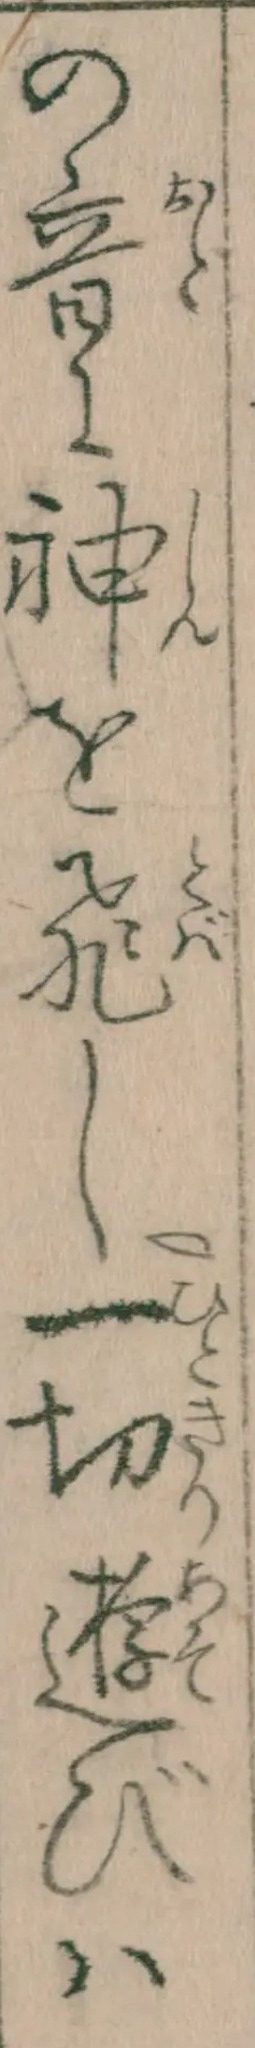の音に神を飛し。一切遊びは
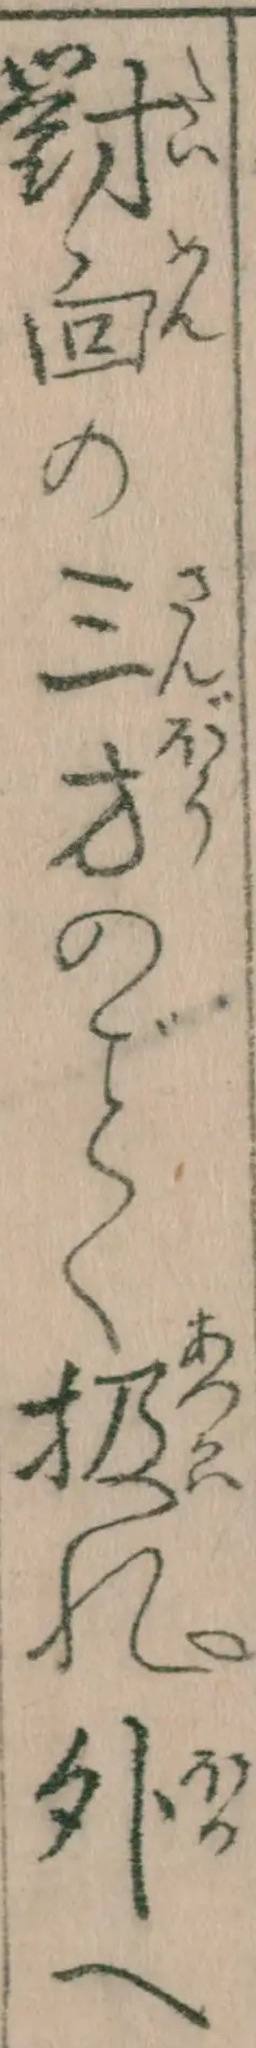対面の三方のごとく扱れ。外へ
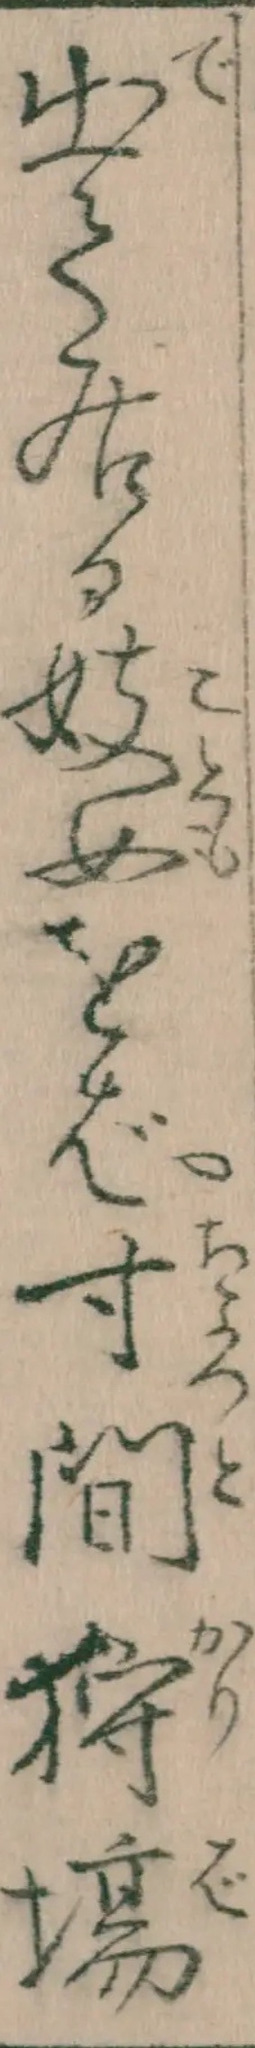出て居る妓女をば。寸間狩塲
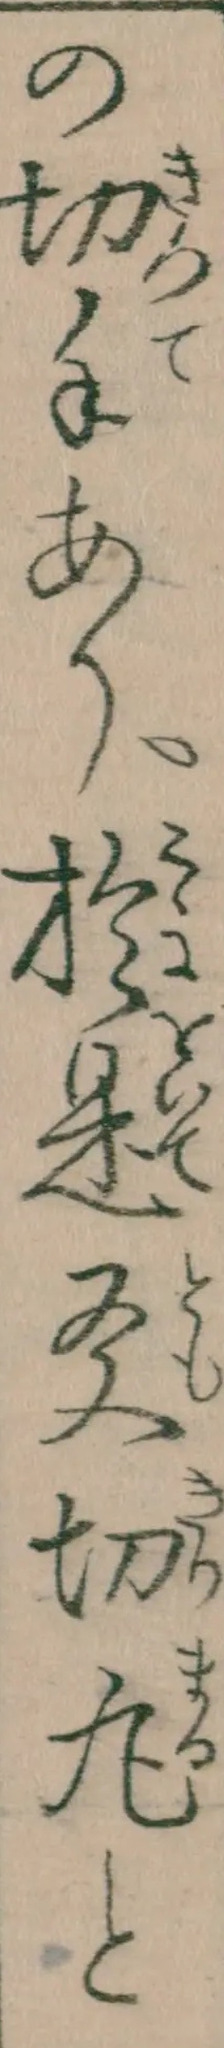の切手あり。於是友切丸と
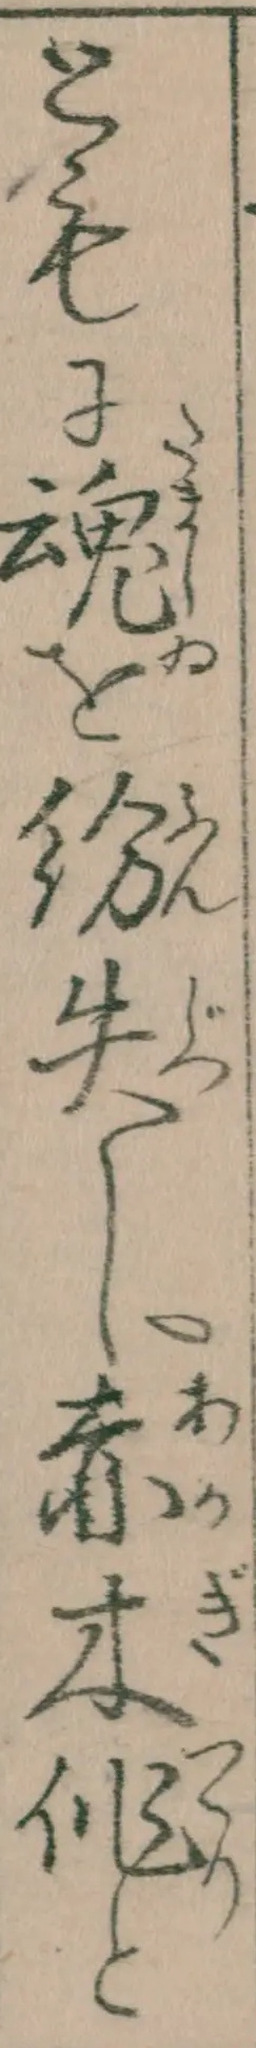ともに魂を紛失し。赤木作と
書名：教訓読本：大礒風俗仕懸文庫
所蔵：国立国会図書館 National Diet Library, JAPAN
